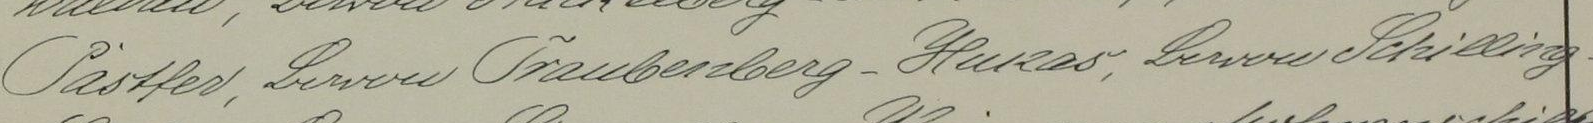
Pastfer, Baron Traubenberg-Hukas, Baron Schilling-
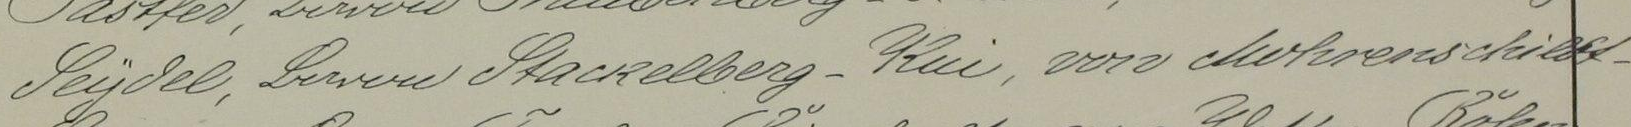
Seydel, Baron Stackelberg-Kui, von Mohrenschildt-
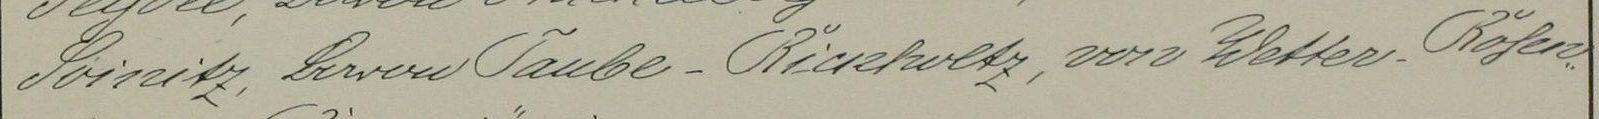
Soinitz, Baron Taube-Rickholtz, von Wetter-Rosen-
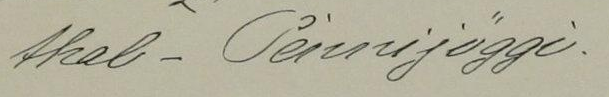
thal-Pennijöggi.
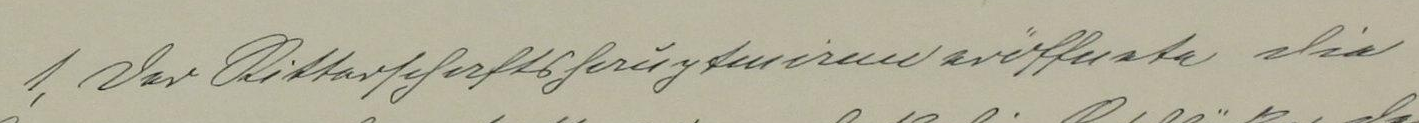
1. Der Ritterschaftshauptmann eröffnete die
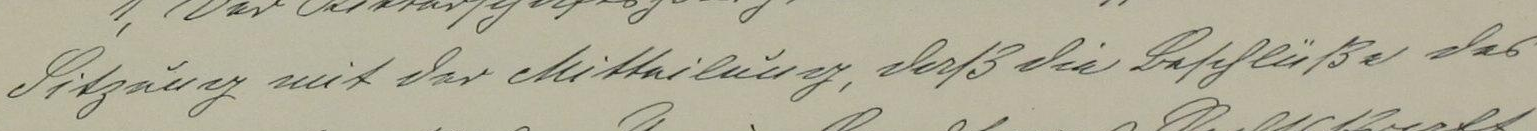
Sitzung mit der Mitteilung, daß die Beschlüße des
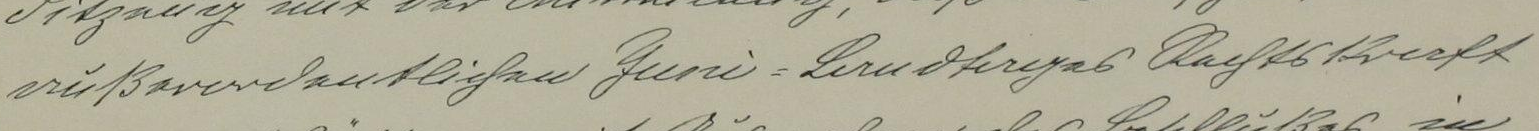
außerordentlichen Juni-Landtages Rechtskraft
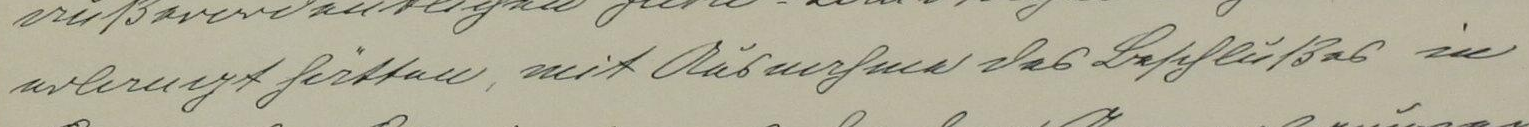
erlangt hätten, mit Ausnahme des Beschlußes in
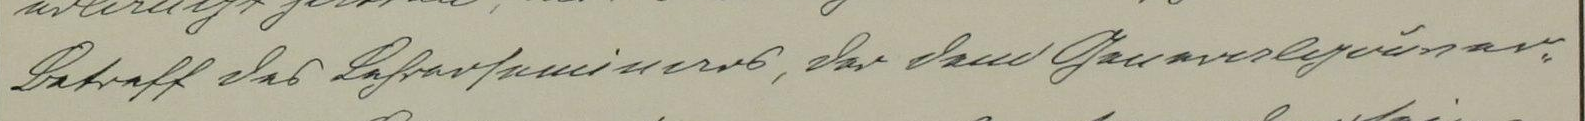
Betreff des Lehrerseminars, der dem Generalgouver-
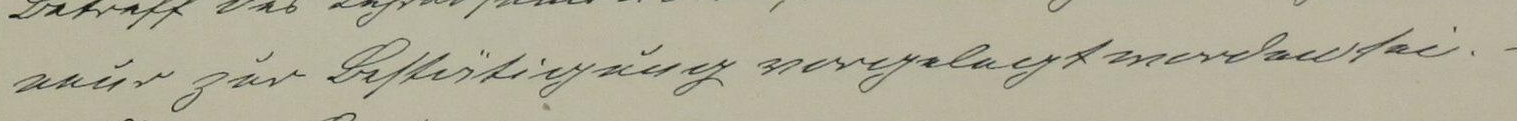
neur zur Bestätigung vorgelegt worden sei.
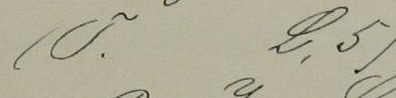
(T. L.5)
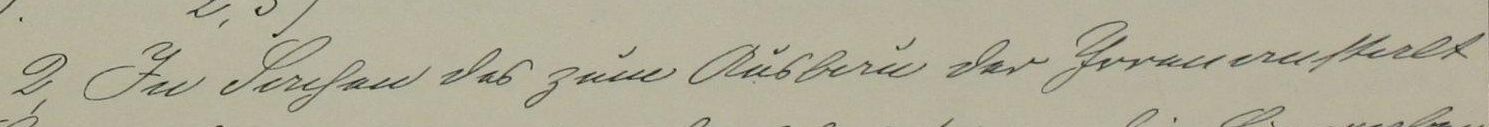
2. In Sachen des zum Ausbau der Irrenanstalt
